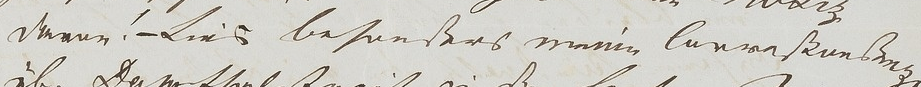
davon! – Lies besonders meine Correspondenzen
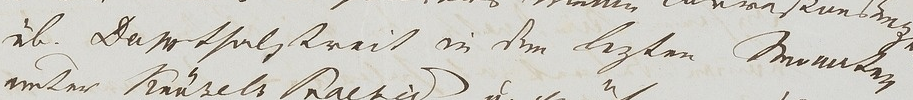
üb. Dapthalstreit in den lezten Monaten
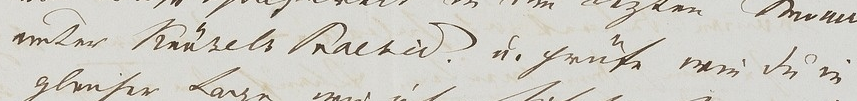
unter Knüsels Praesid. u. prüfe wie du in
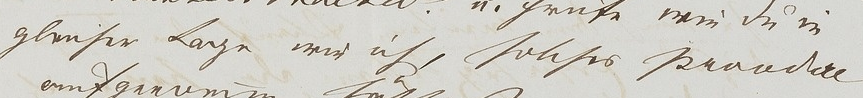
gleicher Lage wie ich, solches procedere
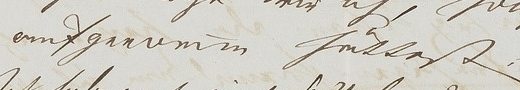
aufgenommen hättest. –
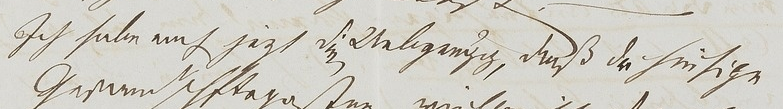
Ich habe noch jezt die Uebzeugg, daß dr hiesige
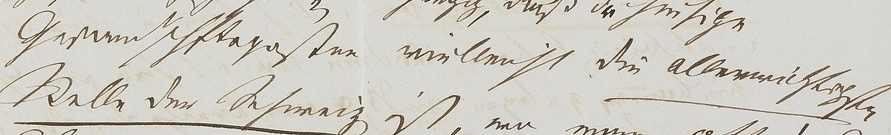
Gesandtschftsposten vielleicht die allerwichtigste
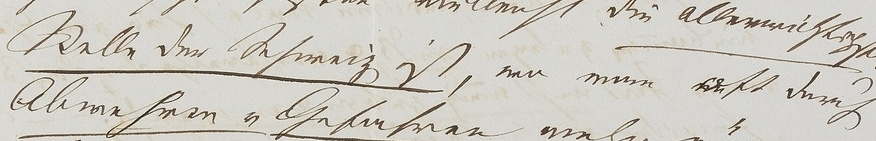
Stelle der Schweiz ist, wo man oft durch
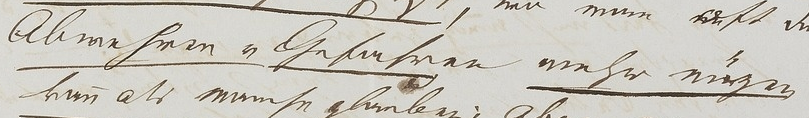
Abwehren v Gefahren mehr nüzen
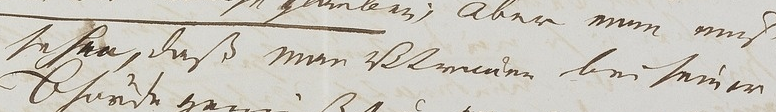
sehen, daß man Vtrauen bei seiner
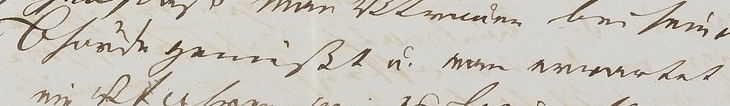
Bhörde genießt u. man erwartet
